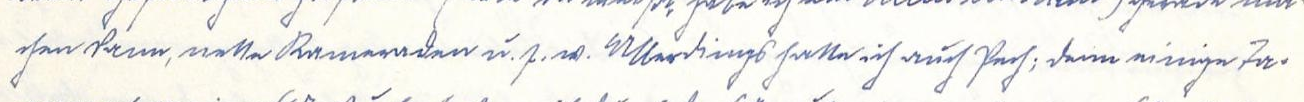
chen kann, nette Kameraden u. s. w. Allerdings hatte ich auch Pech; denn einige Ta-
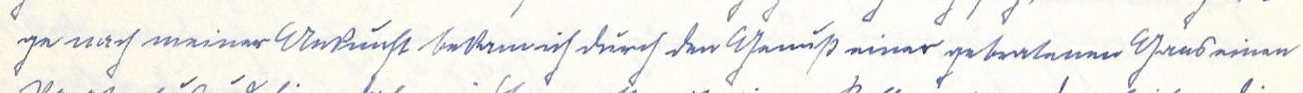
ge nach meiner Ankunft bekam ich durch den Genuß einer gebratenen Gans einen
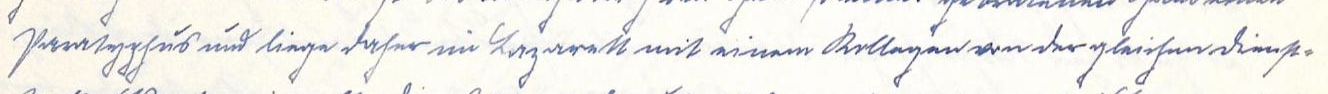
Paratypfus und liege daher im Lazarett mit einem Kollegen von der gleichen Dienst-
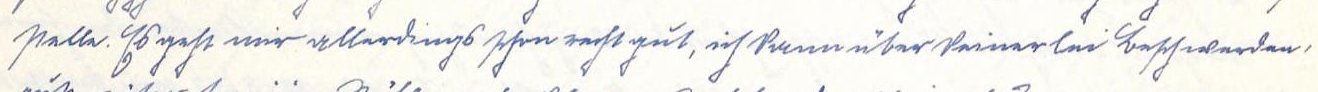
stelle. Es geht mir allerdings schon recht gut, ich kann über keinerlei Beschwerden
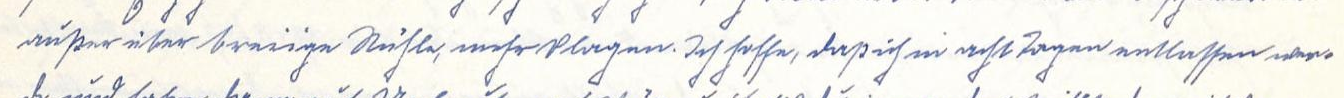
außer über breiige Stühle, mehr klagen. Ich hoffe, daßs ich in acht Tgen entlassen wer-
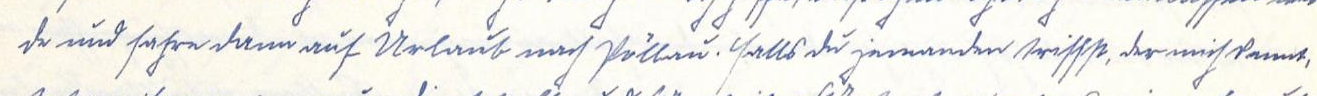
de und fahre dann auf Urlaub nach Pöllau. Falls du jemanden triffst, der mich kennt,
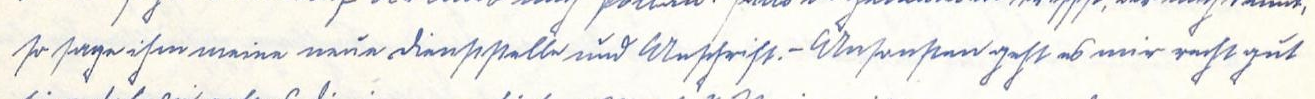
so sage ihm meine neue Dienststelle und Anschrift. Ansonsten geht es mir recht gut
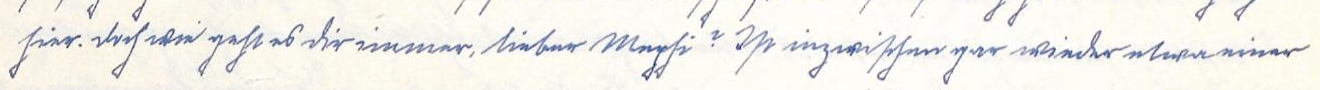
hier. Doch wie geht es dir immer, lieber Mephi? Ist inzwischen gar wieder etwa einer
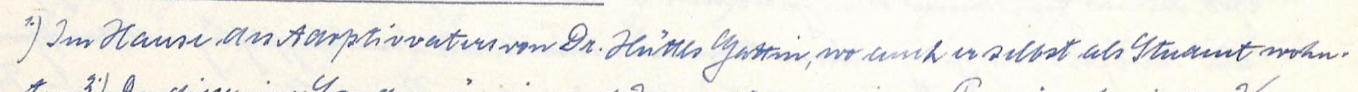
1) Im Hause des Adoptivvaters von Dr. Hüttls Gattin, wo auch er selbst als Student wohn-
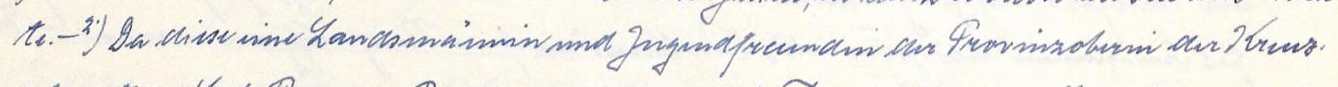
te. 2) Da diese eine Landsmännin und Jngendfreundin der Provinzoberin der Kreuz-
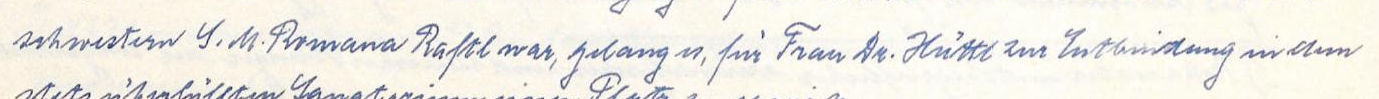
schwestern S M. Romana Raftl war, gelang es, für Frau Dr. Hüttl zur Entbindung in dem
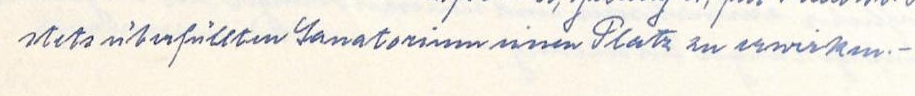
stets überfüllten Sanatorium einen Platz zu erwirken.
